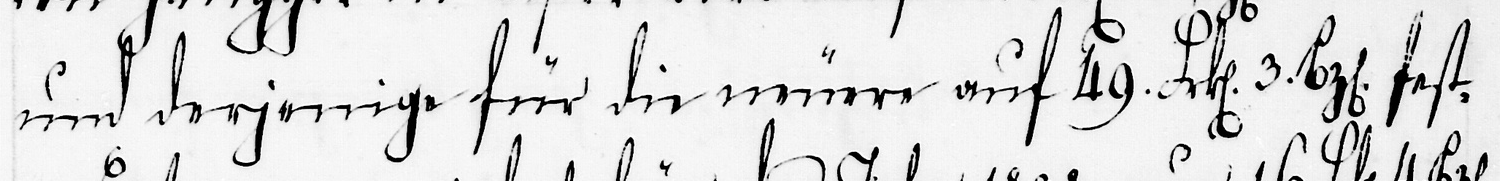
und derjenige für die neuere auf 49. Frk[en]. 3. Bt¬
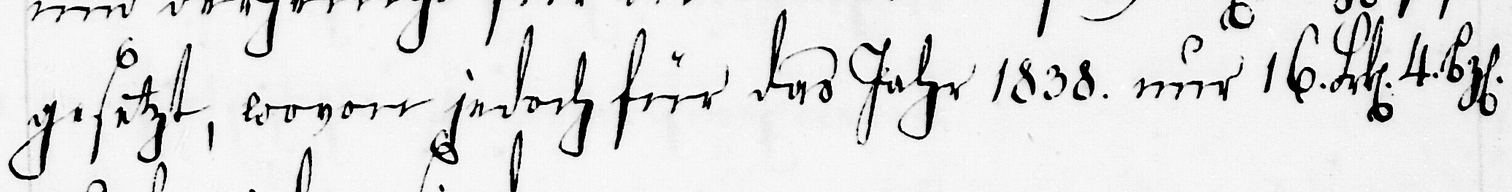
gesetzt, wovon jedoch für das Jahr 1838. nur 16. Frk[en].
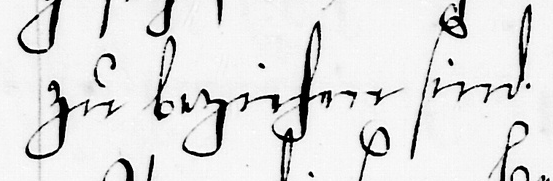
zu beziehen sind.
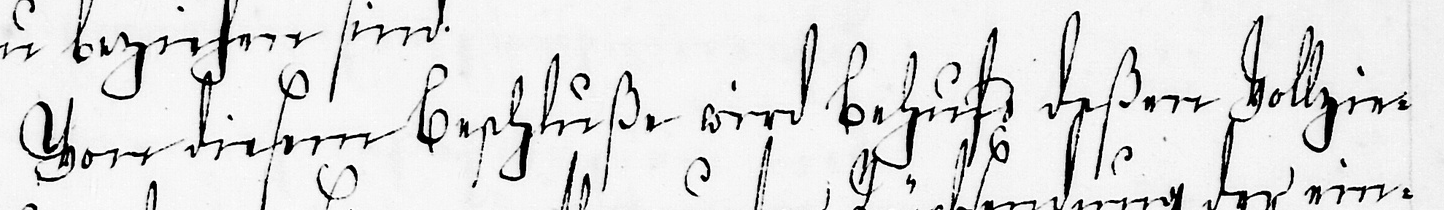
Von diesem Beschluße wird Behufs deßen Vollzi¬
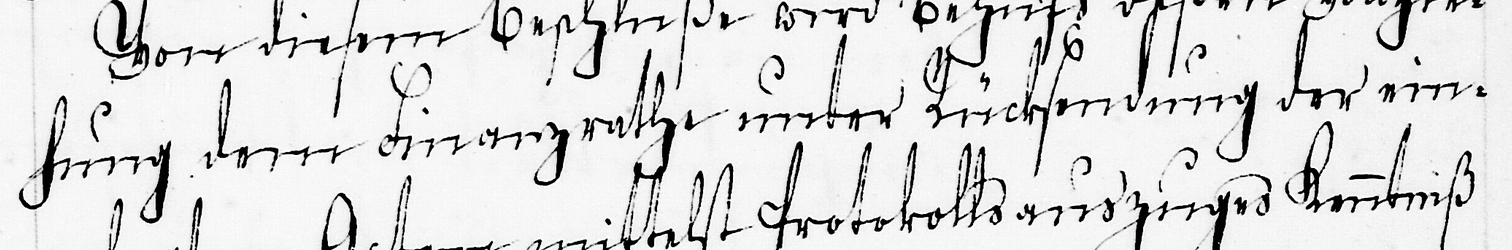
ehung dem Finanzrathe unter Rücksendung der ein¬
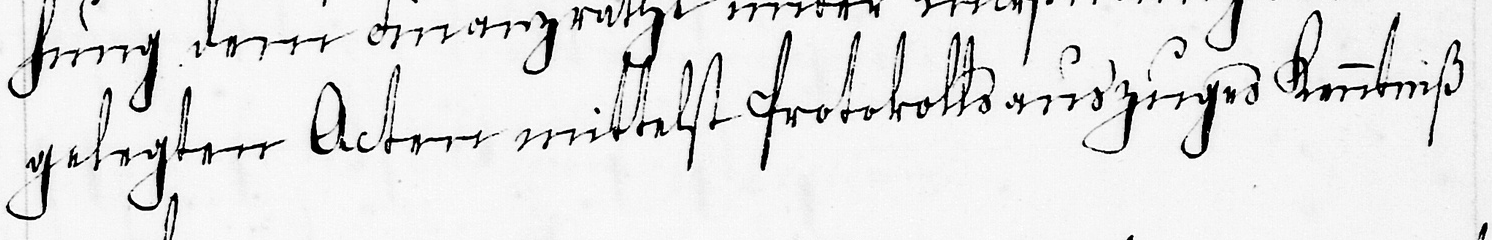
gelegten Acten mittelst Protokollsauszuges Kenntniß
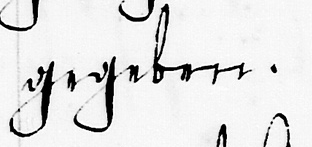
gegeben.
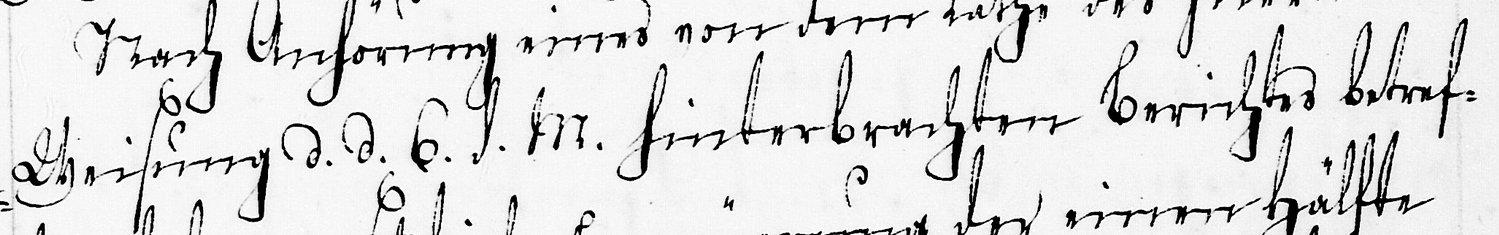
Weisung d. d. 6. d. M. hinterbrachten Berichtes betref¬
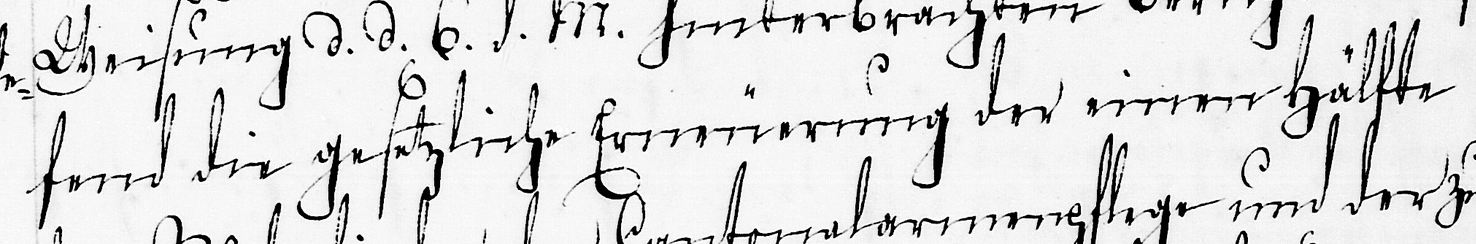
fend die gesetzliche Erneuerung der einen Hälfte
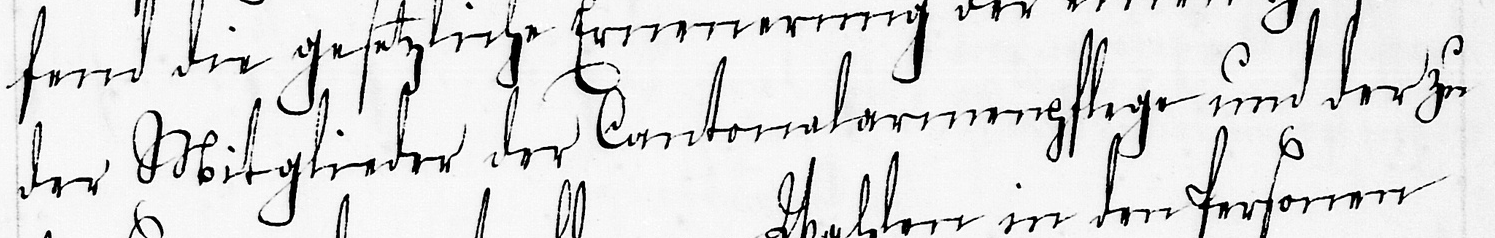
der Mitglieder der Cantonalarmenpflege und der zu
